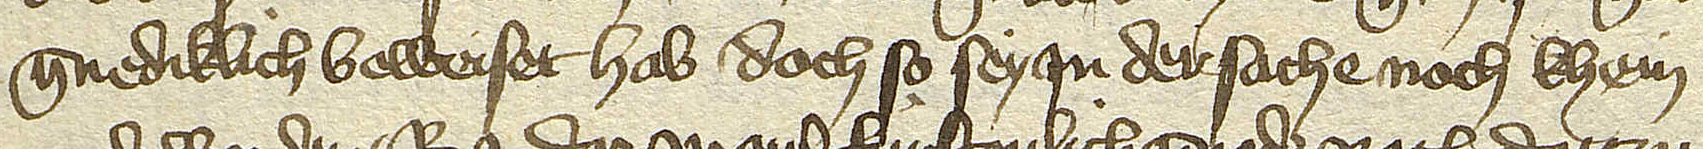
gnediklich beweiſet hab / doch ſo ſey In der ſache noch khein
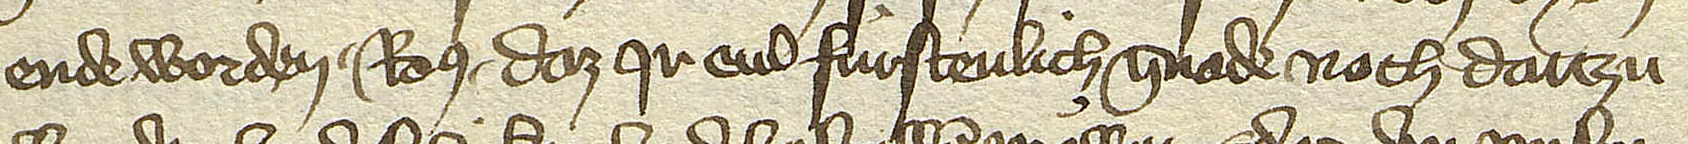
ende worden / Ro* / daʒ Ir ew* fürſtenlich gnade noch darcʒu
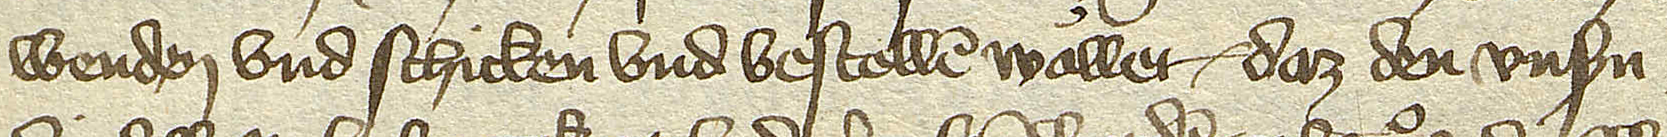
wenden vnd ſchicken vnd beſtelle* wöllet / daʒ den vnſ*n
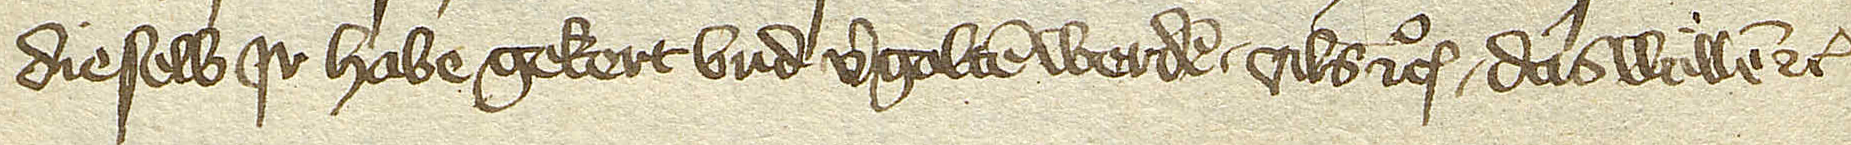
dieſelb Ir habe gekert vnd v*golte* werde* / Als ec* / das wölle* ec*
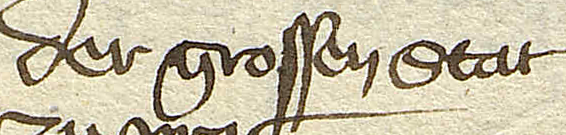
Der groſſen Stat
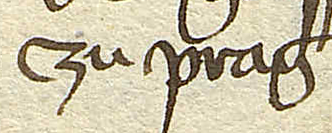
cʒu Prag
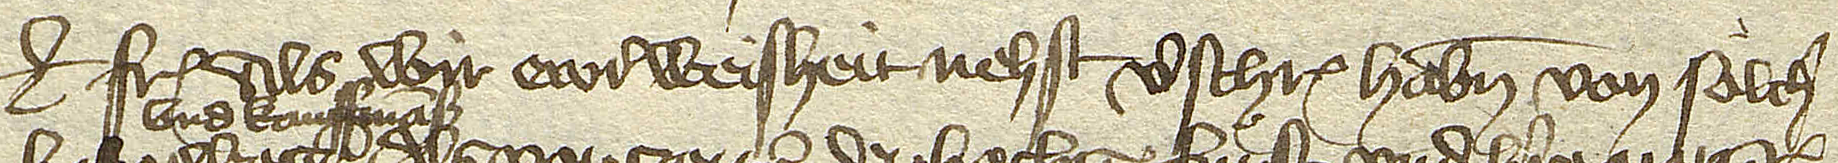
L* fr* Als wir ewr* weiſheit nehſt v*ſchr* habn* von ſölch*
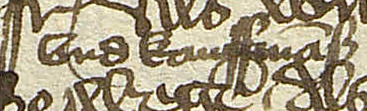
vnd kauffma*ſ*
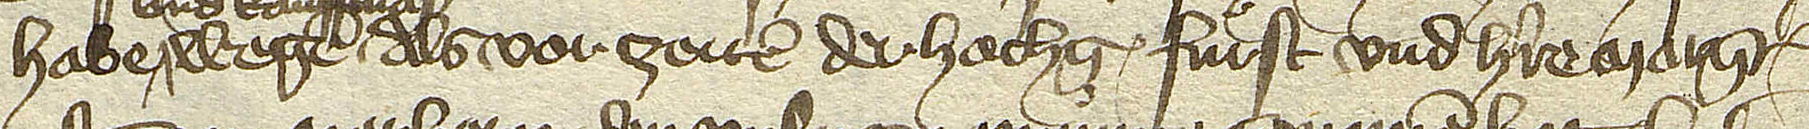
habe wege* / Als vor cʒeite* der hochg* fürſt vnd h*re Margr*
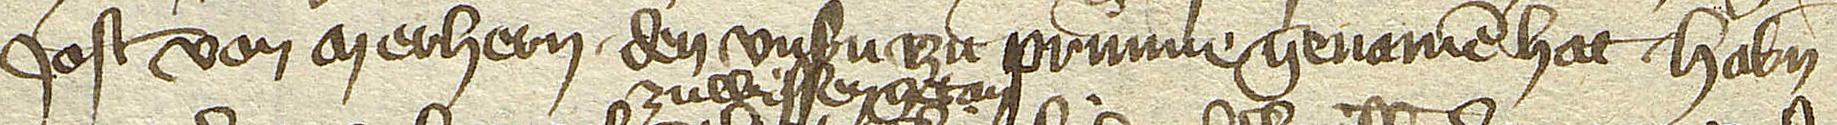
Ioſt von Merhern den vnſ*n cʒu Prünne genome* hat / habn*
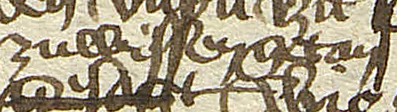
ʒuwiſſen getan
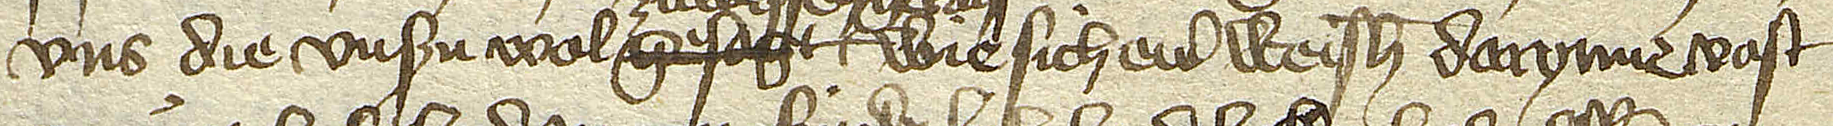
vns die vnſ*n wol geſagt / wie ſich ew* weiſh* darynne vaſt
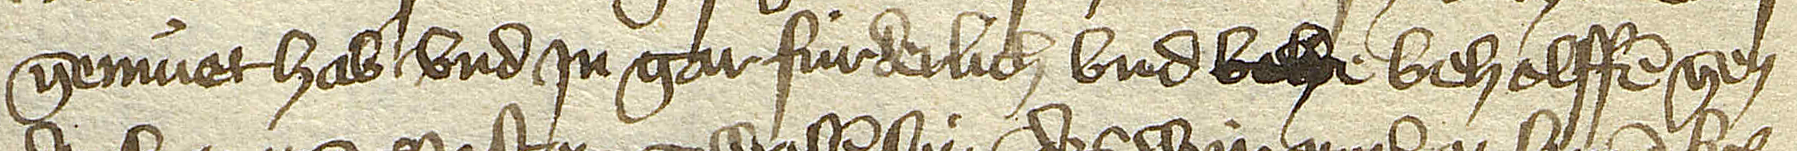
gemüet hab / vnd In gar fürderlich vnd beho beholffe* gen
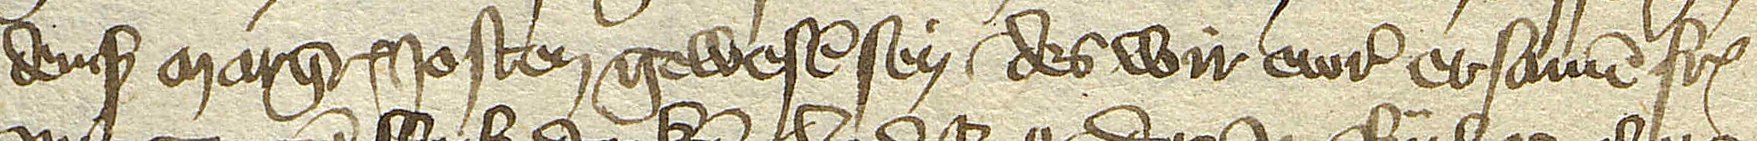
demſ* Margr* Ioſten geweſe* ſey / des wir ewr* erſame* fr*
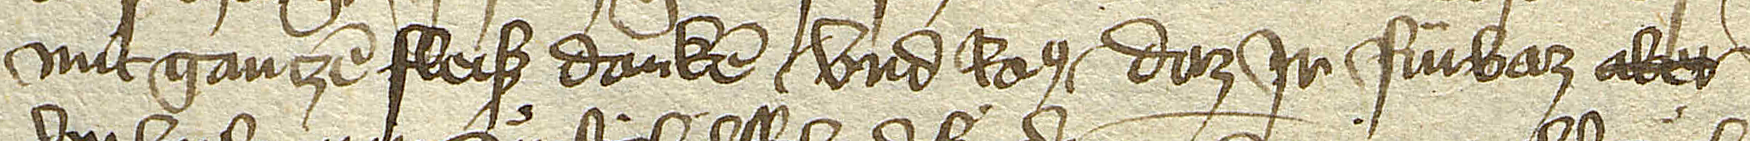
mit gancʒe* fleiſʒ danke* / vnd Ro* / daʒ Ir fürbaʒ aber
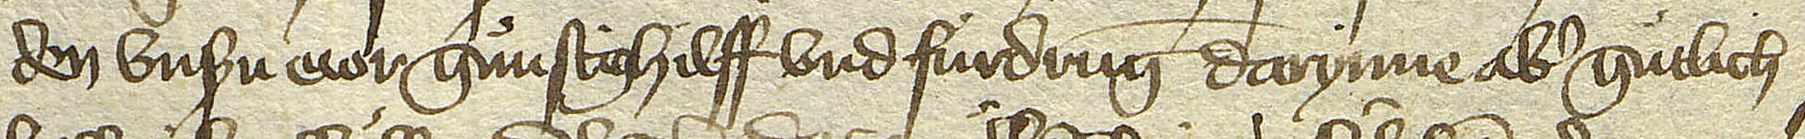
den vnſ*n ewr günſtighilff vnd fürdrug* darynne ab* gütlich
